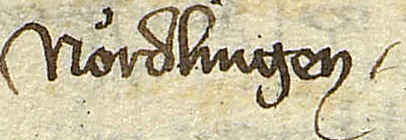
Nördlingen /
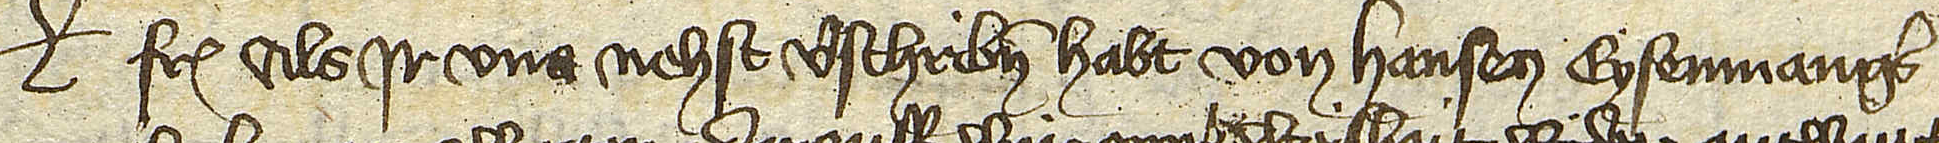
L* fr* Als Ir nehſt v*ſchribn* habt von hanſen Eyſenmangs*
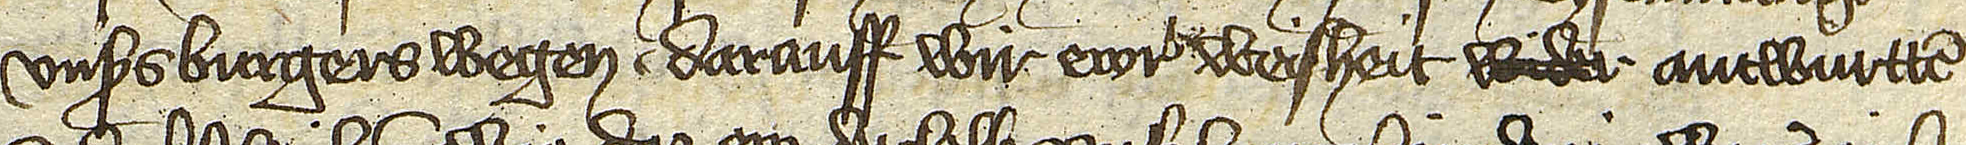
vnſ*s burgers wegen / darauff wir ewr* weiſheit wider antwurtte*
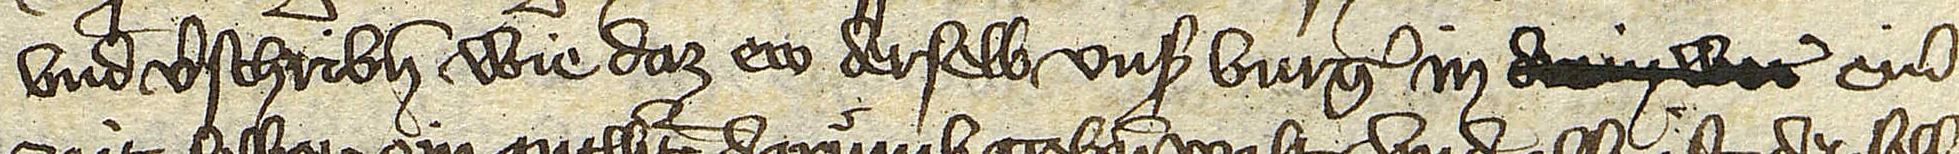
vnd v*ſchribn* / wie daʒ ew derſelb vnſ* burg* in drein woc ein*
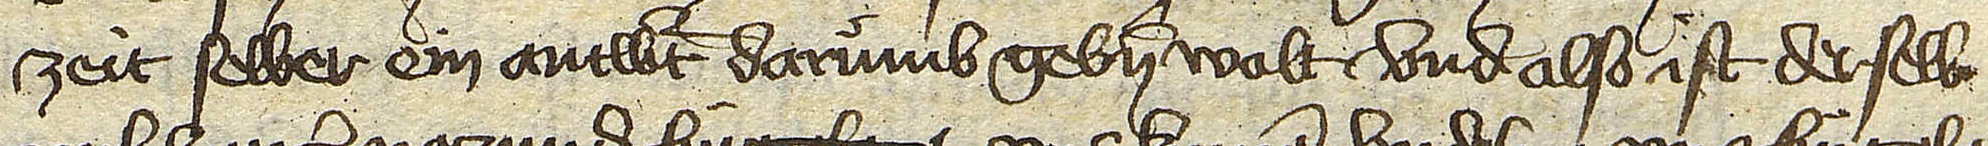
cʒeit ſelber ein antw*t darümb gebn* wolt / vnd alſo iſt derſelb*
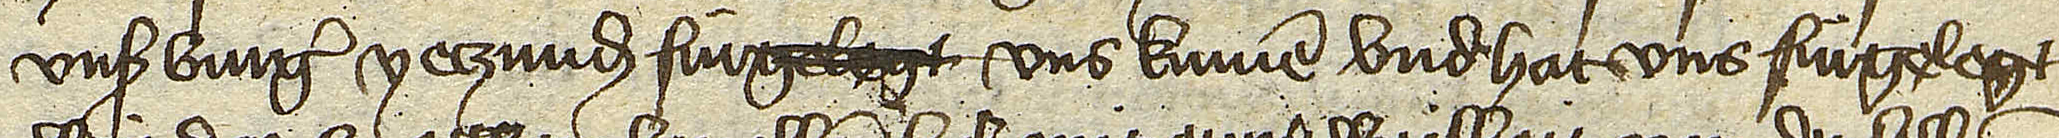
vnſ* burg* yecʒund* fürgelegt vns kume* vnd hat vns fürgelegt
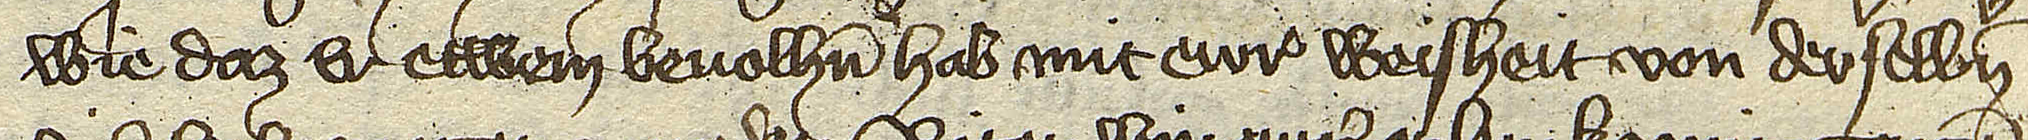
wie daʒ Er etwem beuolhn* hab mit ewr* weiſheit von derſelbn*
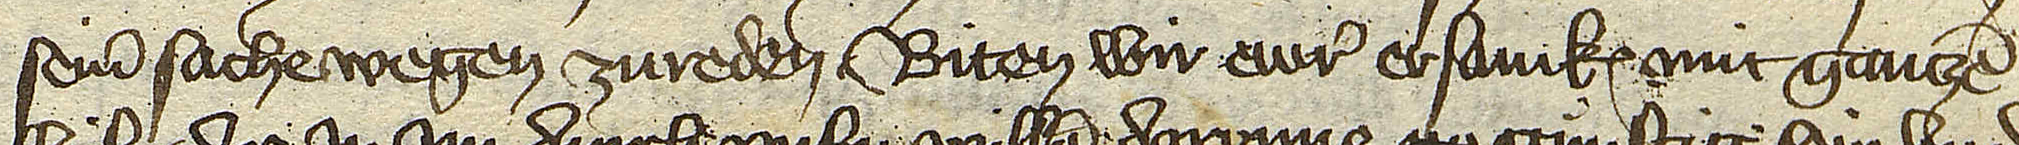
ſein* ſache wegen cʒu reden / Biten wir ewr* erſamk* mit gancʒe*
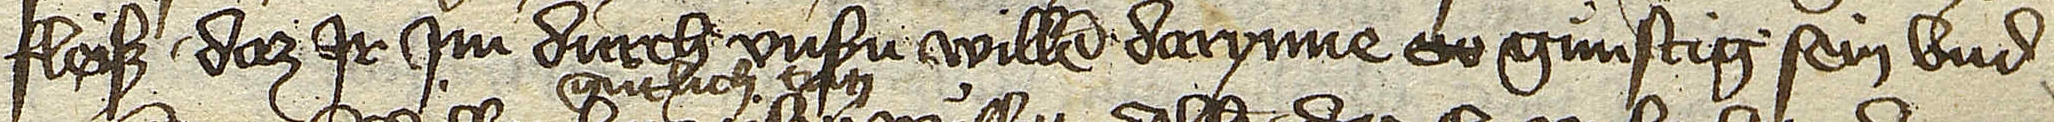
fleiſʒ / daʒ Ir Im durch vnſ*n wille* darynne ew günſtig ſein vnd
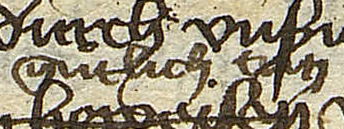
gütlich tun
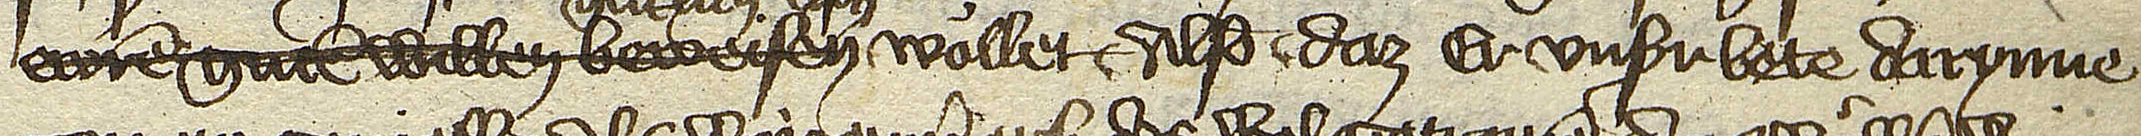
ewre* gute* willen beweiſen wöllet / Alſo / daʒ Er vnſ*r bete darynne
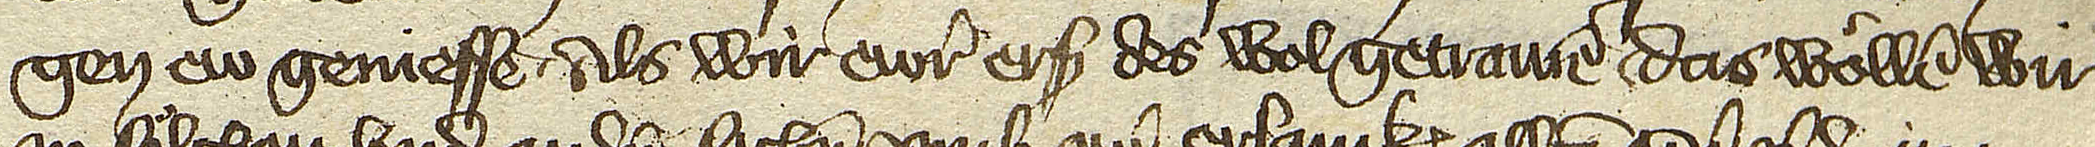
gen ew genieſſe / Als wir ewr* erſ* des wol getrawe* / das wölle* wir
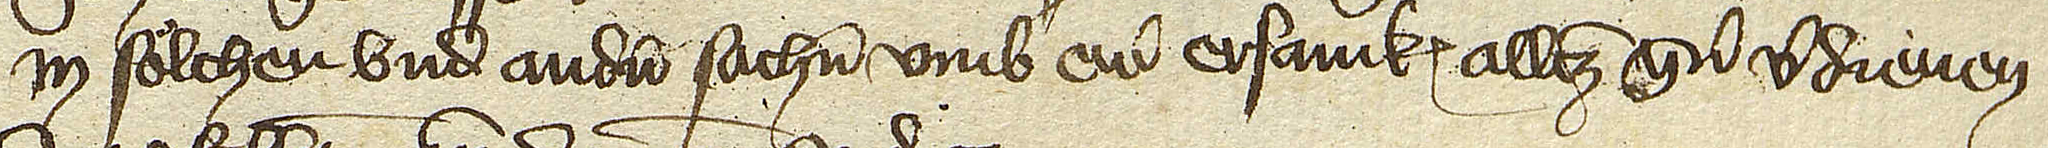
in ſölichen vnd andn* ſachn* vmb ew* erſamk* allcʒ* gn* v*dienen
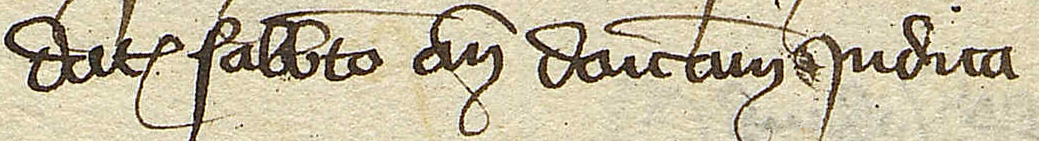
dat* ſabbto* an* doicam* Iudica
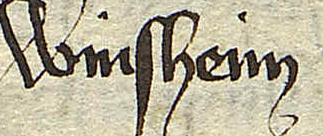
Winſheim
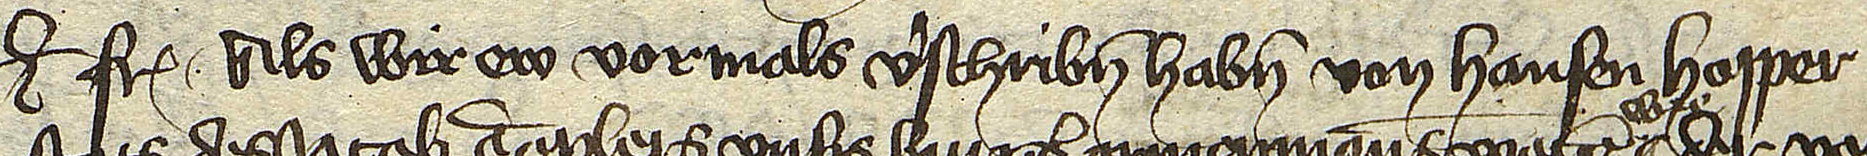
L* fr* / Als wir ew vormals v*ſchribn* habn* von hanſen hopper
